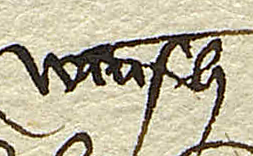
winſh*
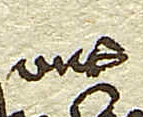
vns
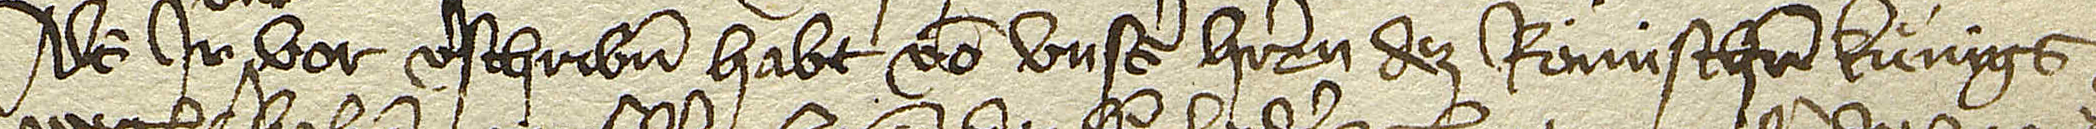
Als Ir vor v*ſchribn* habt vo* vnſs* hr*en deʒ Römiſchn* künigs
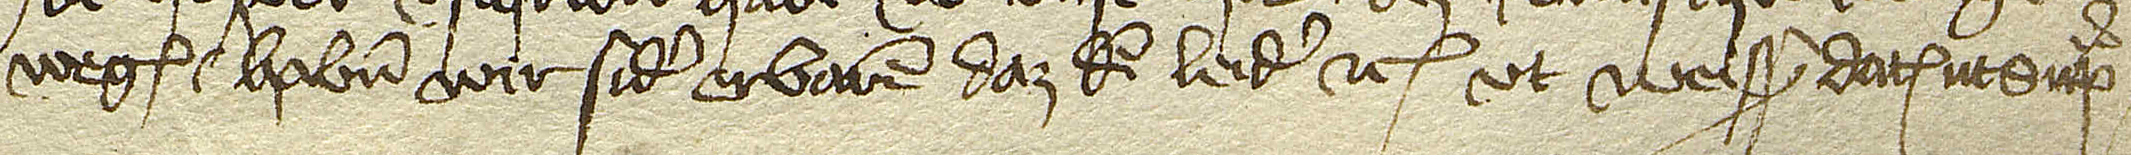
weg* / habn* wir ſid* ervare* daʒ d* leid* ec* vt weiſſ* dat* ut Sup* /
